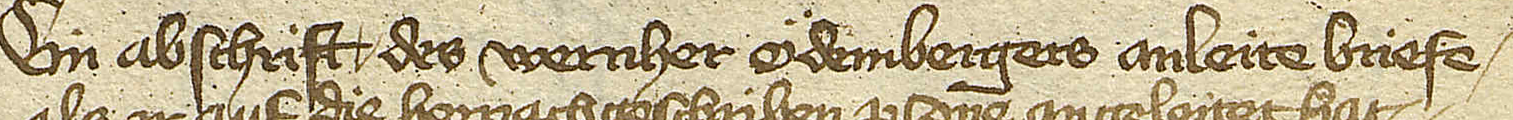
Ein abſchrift des wernher Ödembergers anleite briefe /
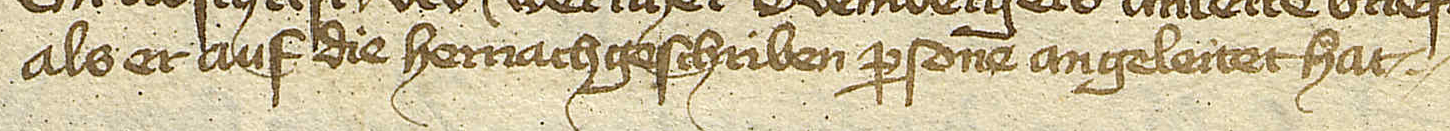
als er auf die hernachgeſchribn p*ſone angeleitet hat . /
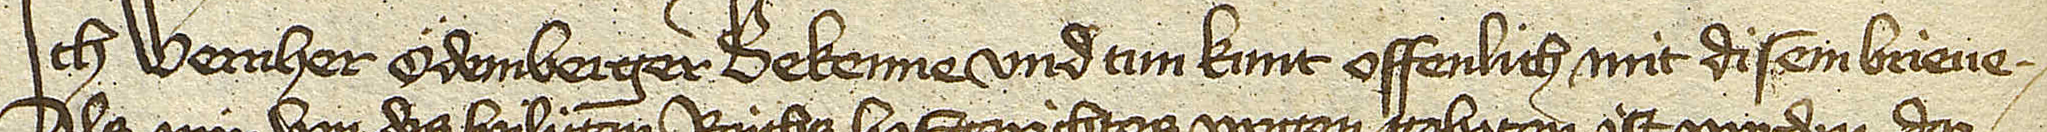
Ich Wernher Ödemberger Bekenne vnd tun kunt offenlich mit diſem brieue - /
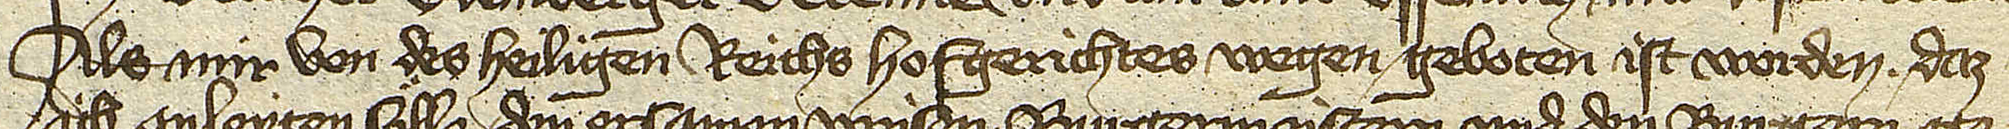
Als mir von des heiligen Reichs hofgerichtes wegen / geboten iſt worden . daʒ
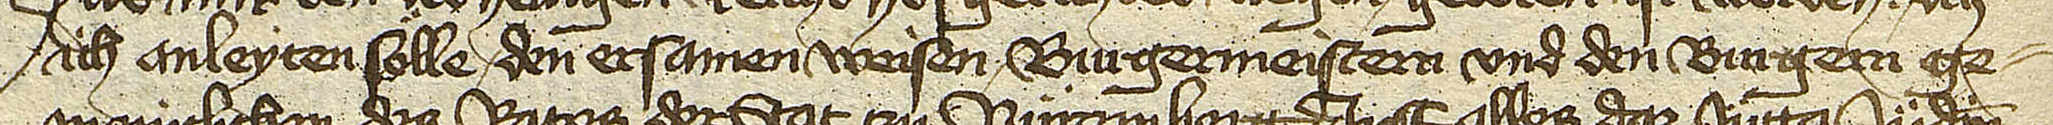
ich anleyten ſölle / den erſamen weiſen Burgermeiſtern vnd den Burgern ge =
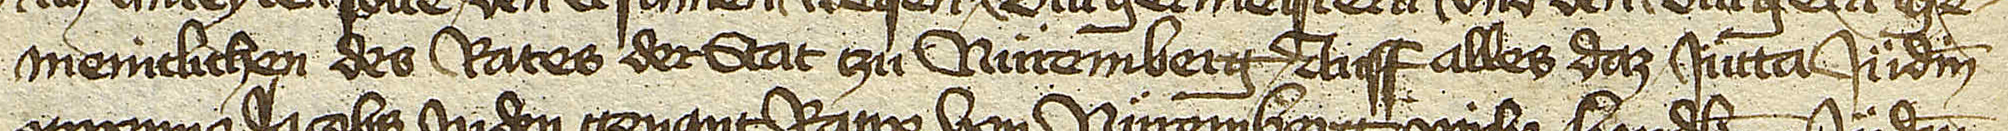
meintlichen des Rates der Stat cʒu Nüremberg / Auff alles daʒ Iütta Iüdin*
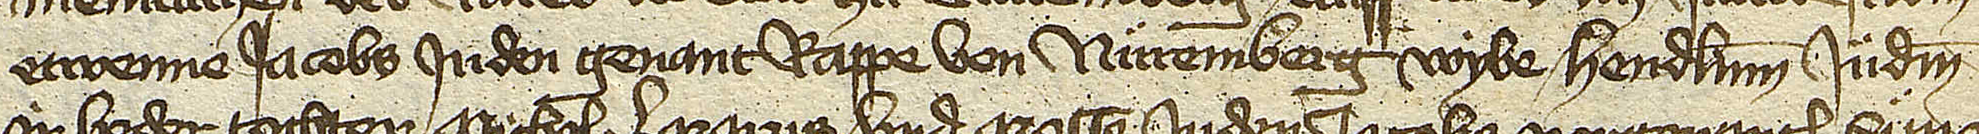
etwenne Iacobs Iuden genant Rappe von Nüremberg wybe / hendlinn* Iüdin*
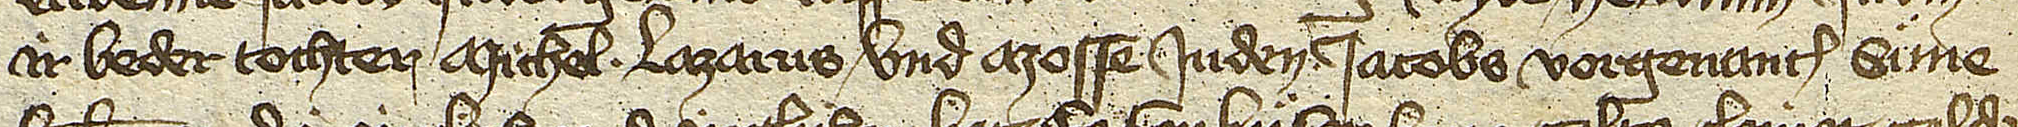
ir beder tochter Michel . Laʒarus / vnd Moſſe Iuden . Iacobs vorgenant* Süne
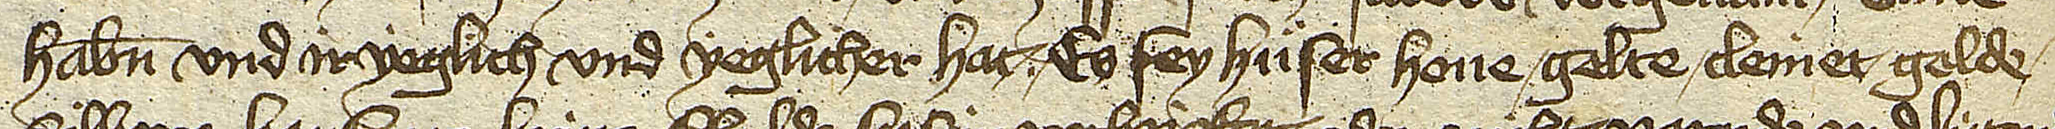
habn* vnd ir yeglich vnd yeglicher hat / . Es ſey hüſer houe/ gelte / cleiner gelde /
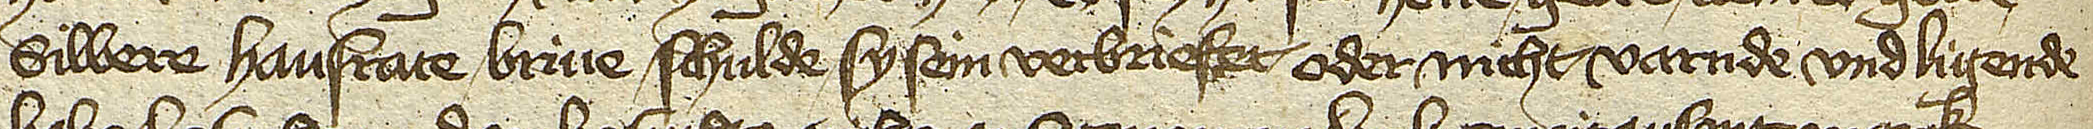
Silbere hauſrate / briue / ſchulde / ſy ſein verbriefet / oder nicht / varnde vnd ligende
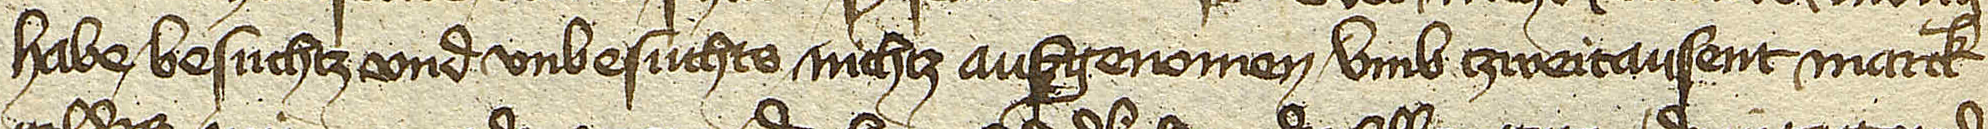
habe / beſuchtʒ vnd vnbeſuchts / nichtʒ auſʒgenomen / Vmb cʒweitauſent marck
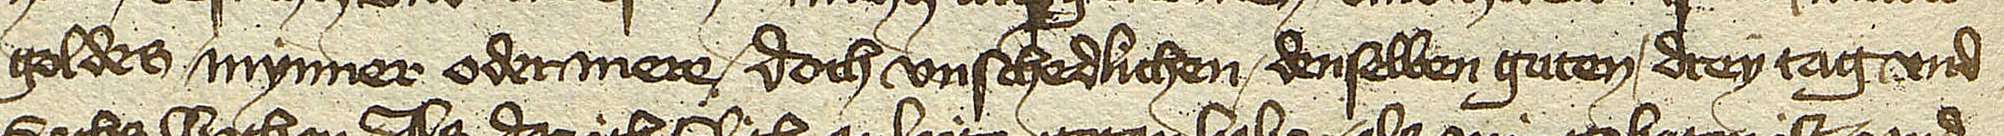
goldes / mynner oder mere / doch vnſchedlichen / denſelben guten / drey tag vnd
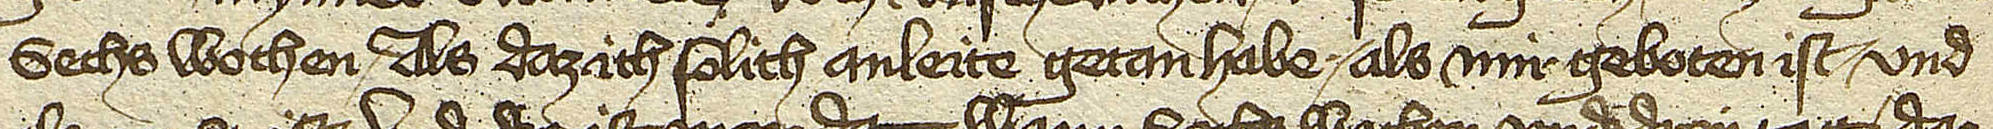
Sechs Wochen / Als daʒ ich ſölich anleite getan habe . / als mir geboten iſt / vnd
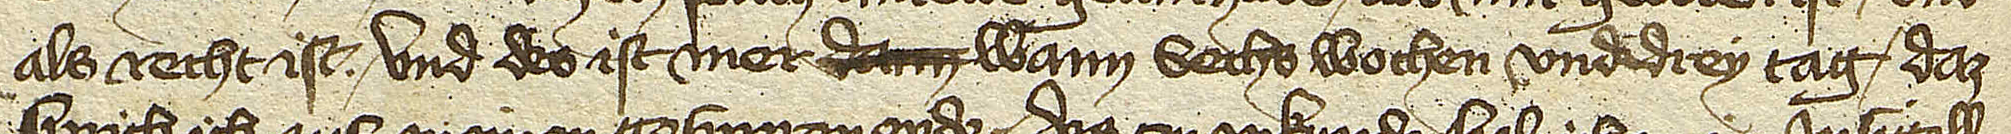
als recht iſt . / Vnd des iſt mer dann wann Sechs Wochen vnd drey tag / daʒ
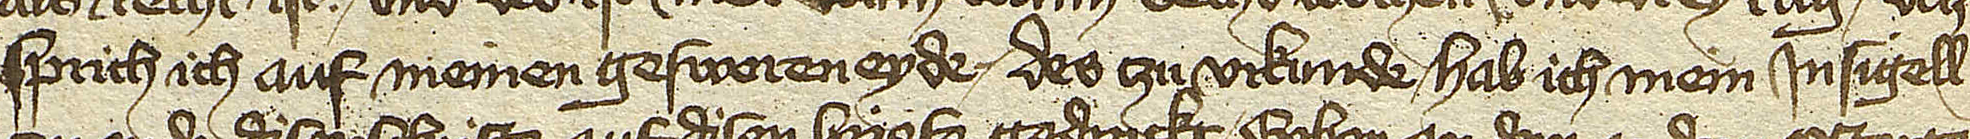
ſprich ich auf meinen geſworen eyde / des cʒu vrkunde / hab ich mein Inſigell
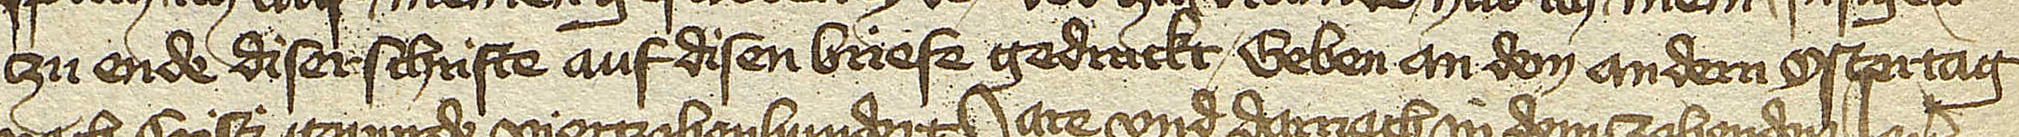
cʒu ende diſer ſchrifte auf diſen briefe gedruckt / Geben an dem andern Oſtertag
